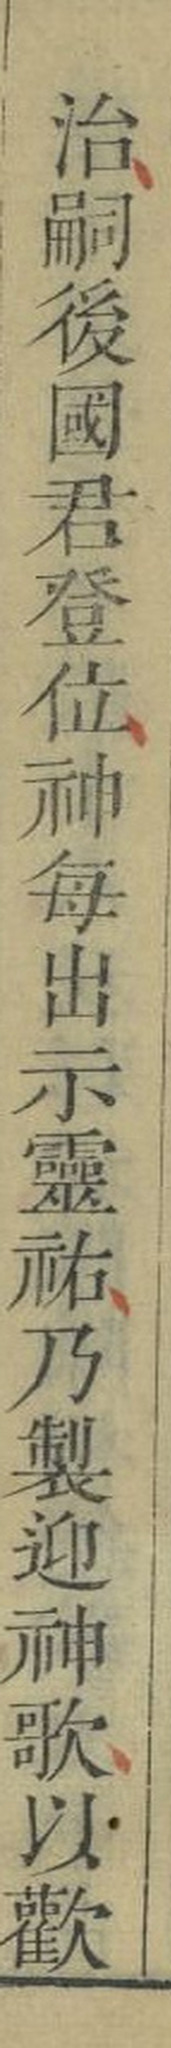治嗣後國君登位神每出示靈祐乃製迎神歌以歡
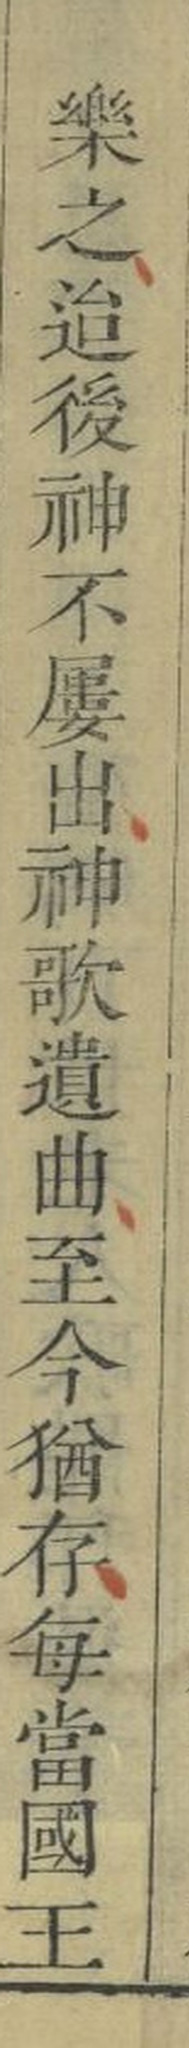樂之迨後神不屢出神歌遺曲至今猶存每當國王
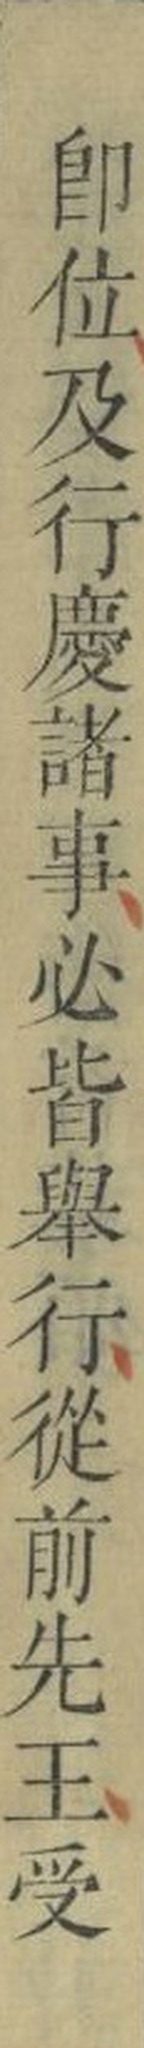卽位及行慶諸事必皆舉行從前先王受
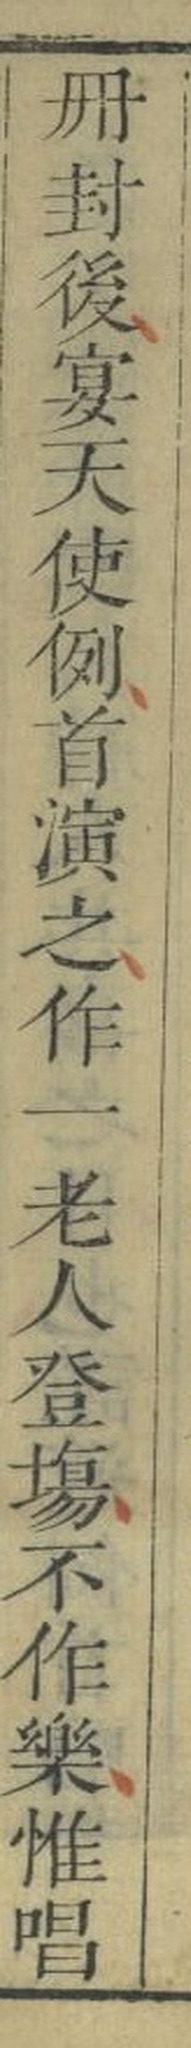冊封後宴天使例首演之作一老人登塲不作樂惟唱
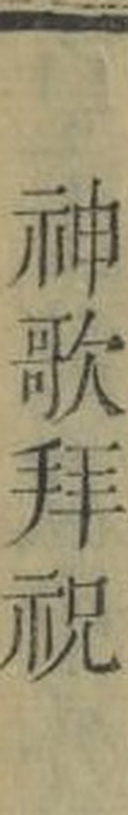神歌拜祝

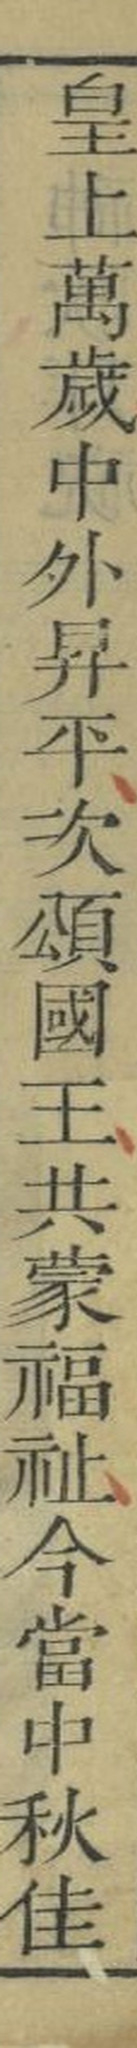皇上萬歲中外昇平次頌國王共蒙福祉今當中秋佳
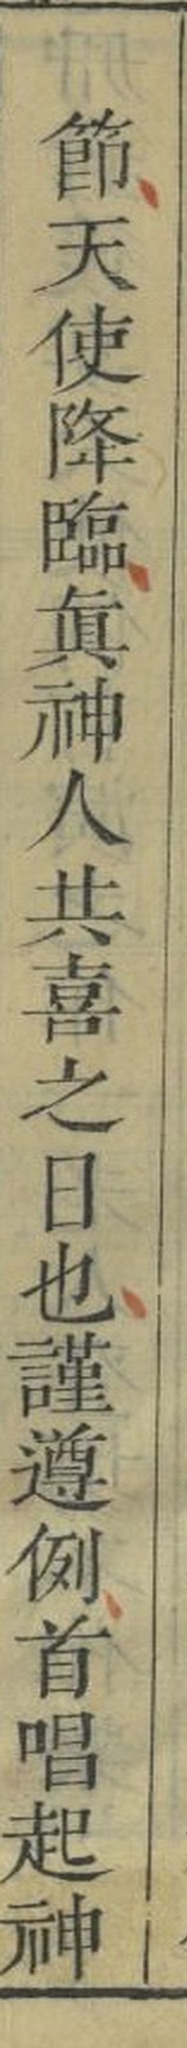節天使降臨眞神人共喜之日也謹遵例首唱起神
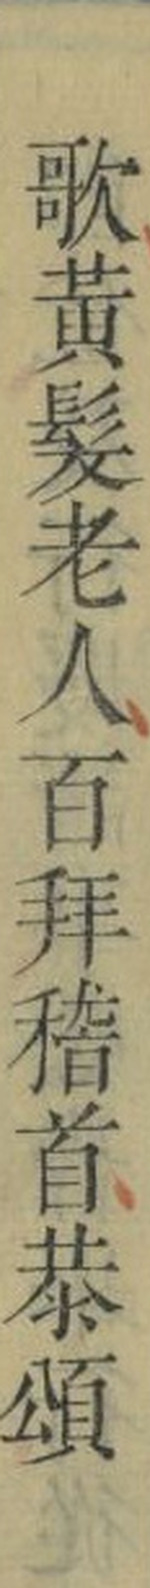歌黃髪老人百拜稽首㳟頌
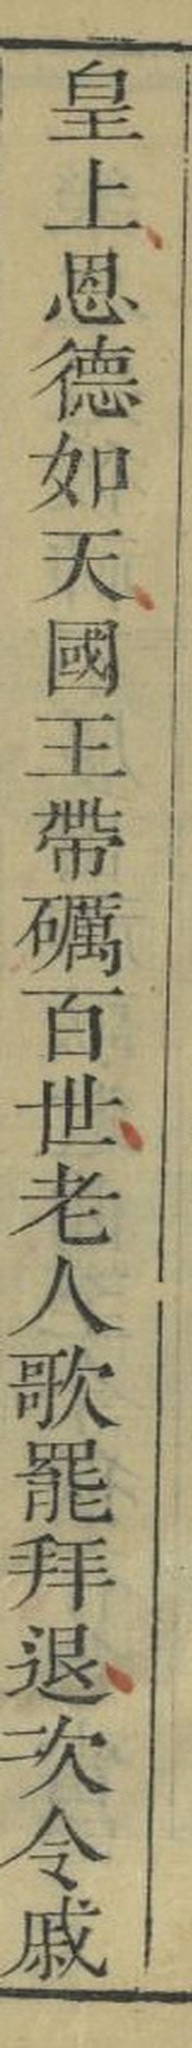皇上恩德如天國王帶礪百世老人歌罷拜退次令戚
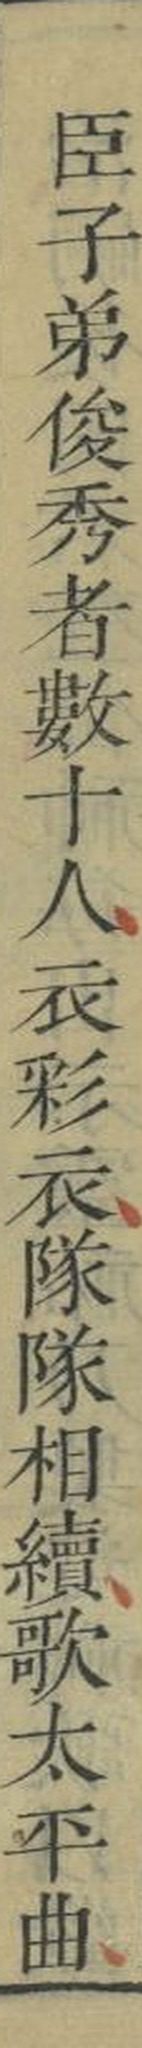臣子弟俊秀者數十人衣彩衣隊隊相續歌太平曲
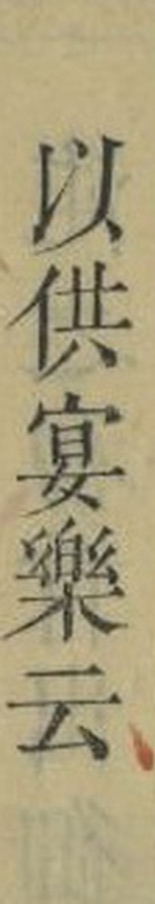以供宴樂云
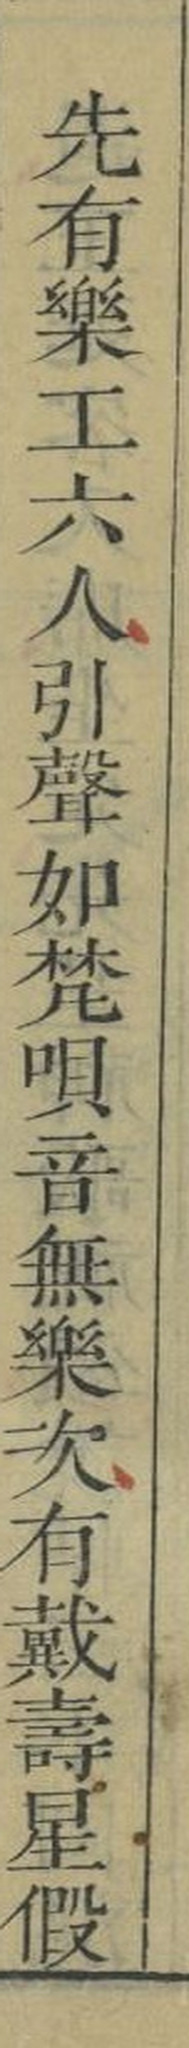先有樂工六人引聲如梵唄音無樂次有戴壽星假
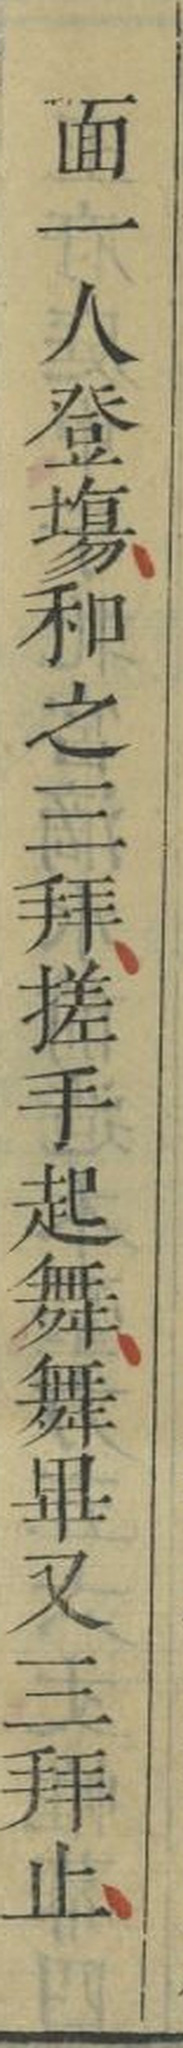面一人登塲和之三拜搓手起舞舞畢又三拜止
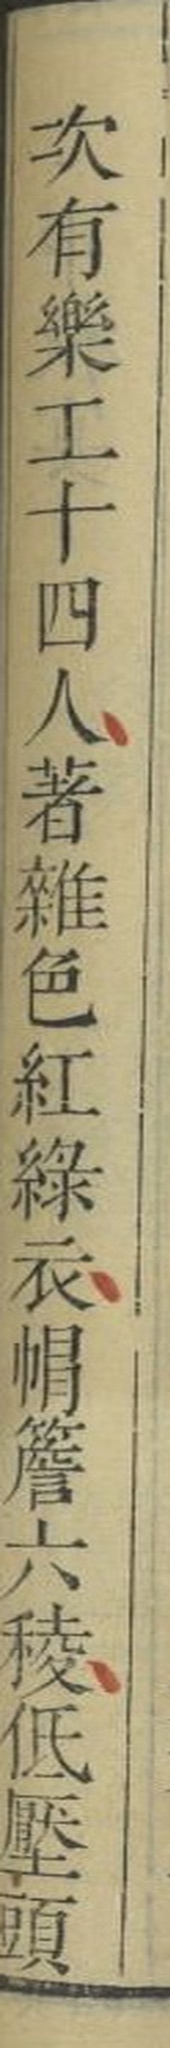次有樂工十四人著雜色紅綠衣帽簷六稜低壓頭
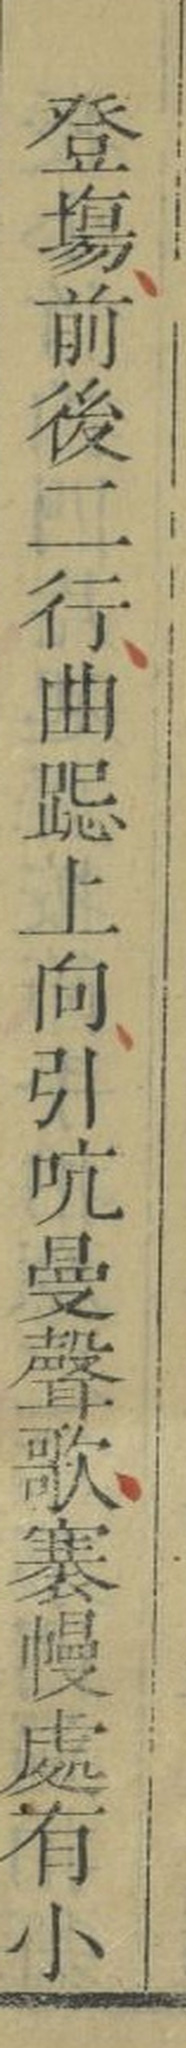登塲前後二行曲跽上向引吭曼聲歌褰幔處有小
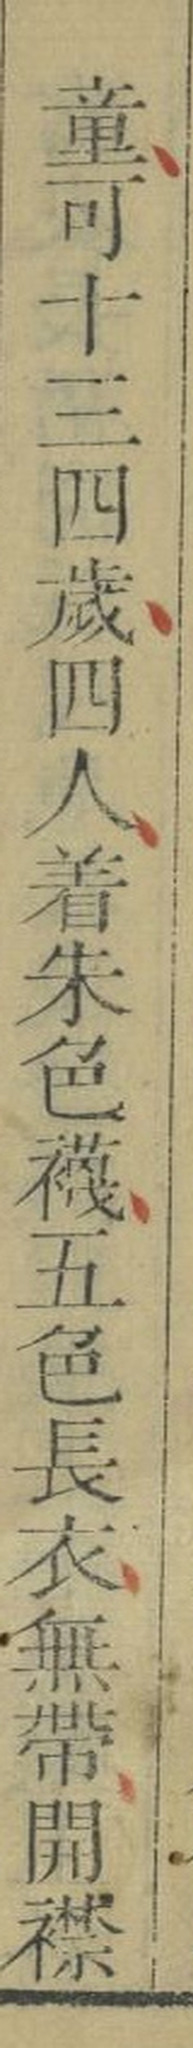童可十三四歲四人着朱色襪五色長衣無帶開襟
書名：中山伝信録 巻一、巻二
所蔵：University of the Ryukyus Library
